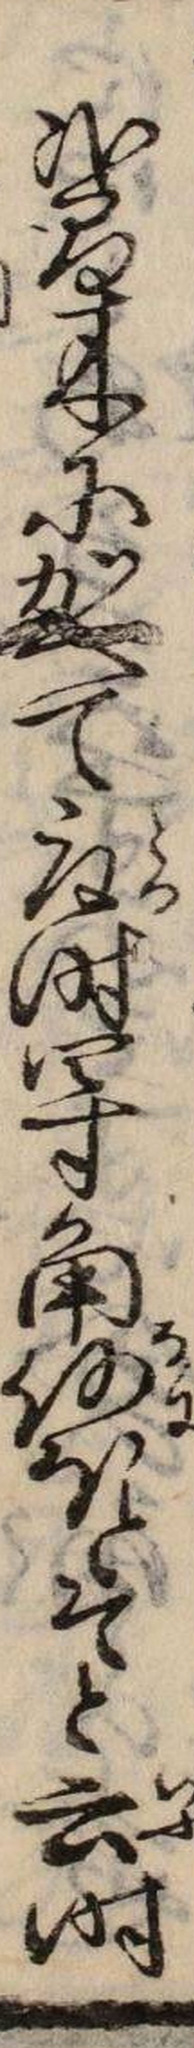弐間木にかへて取時四寸角何ほとそと云時
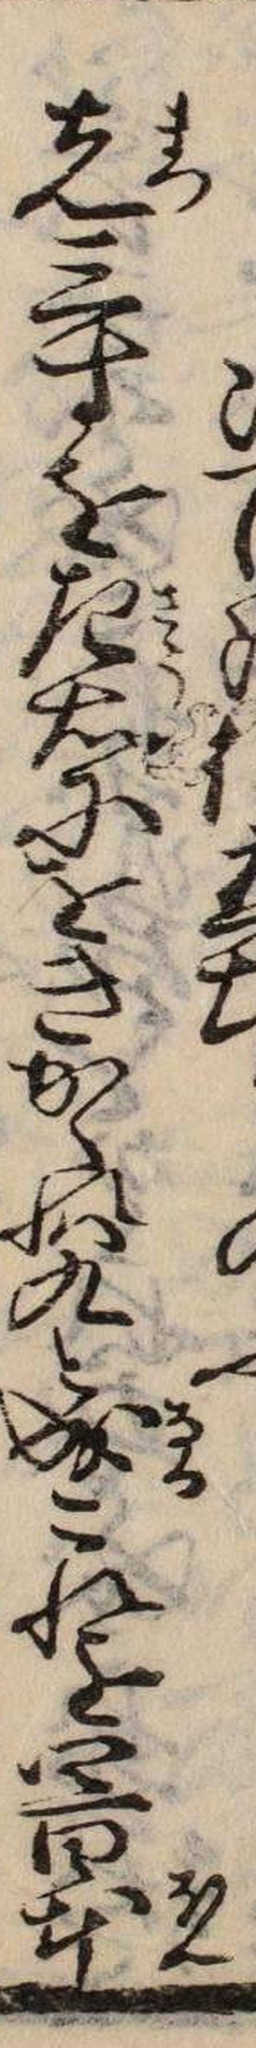先三寸を左右にをきかくれは九と成これを四百本
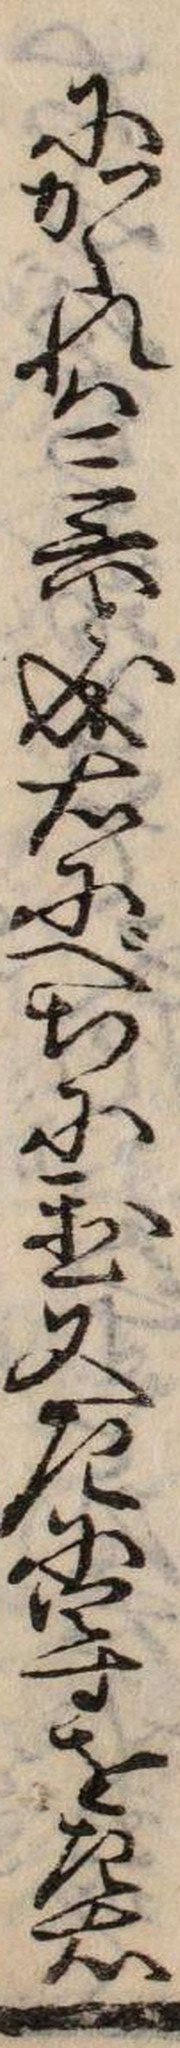にかくれは三六と成右にべちに置又左に四寸を左右
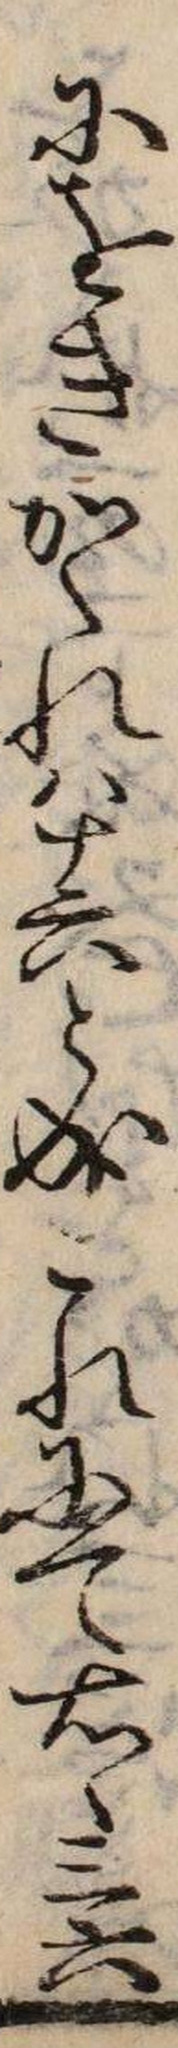にをきかくれは十六と成これにて右の三六
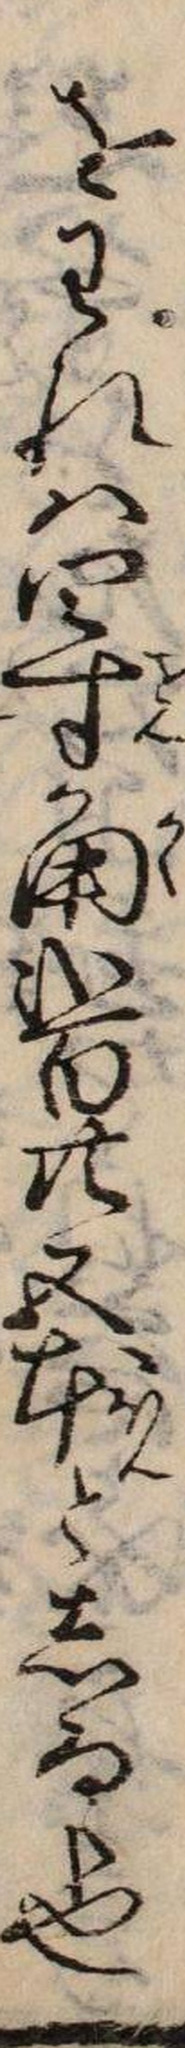をわれは四寸角弐百廿五本としるる也
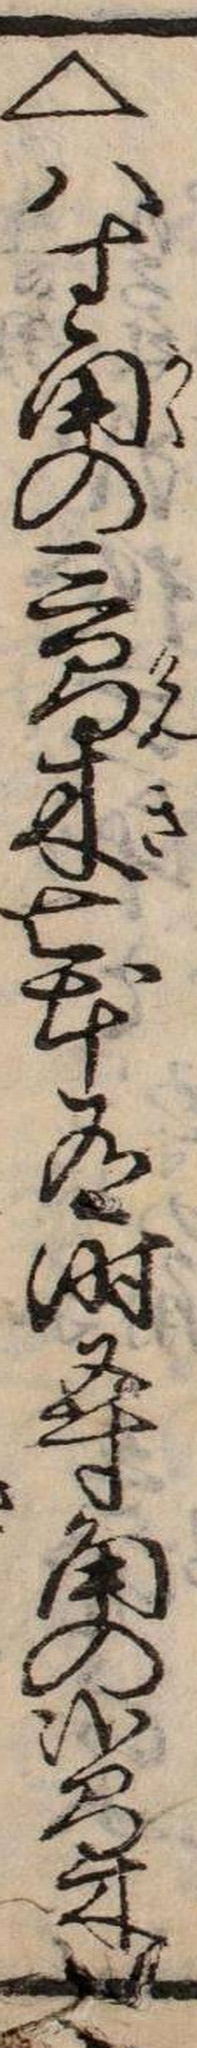△八寸角の三間木七本有時五寸角の弐間木
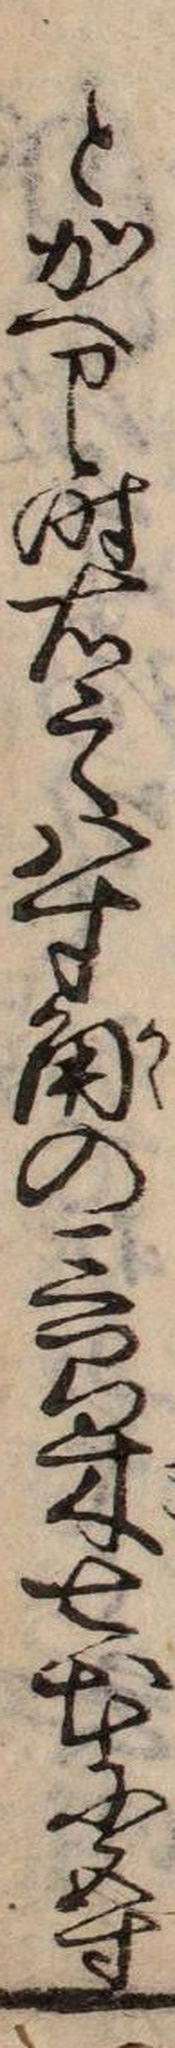とかへ申候時右の八寸角の三間木七本に五寸

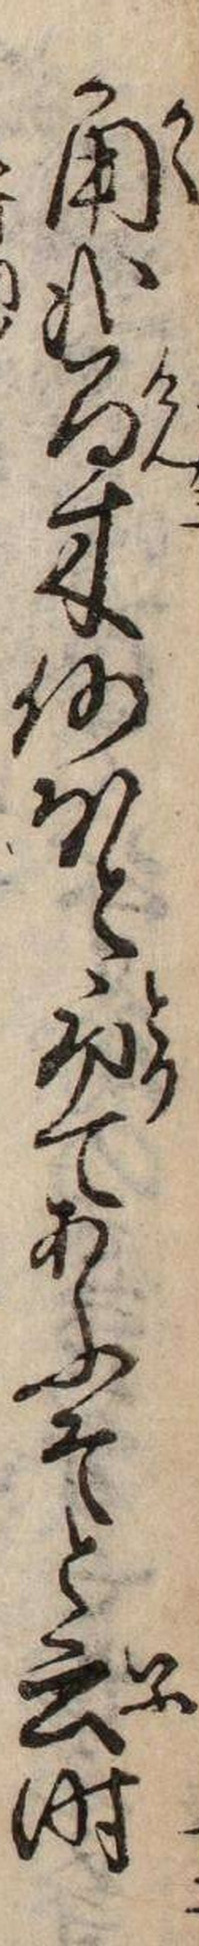角弐間木何ほと取てあふそと云時
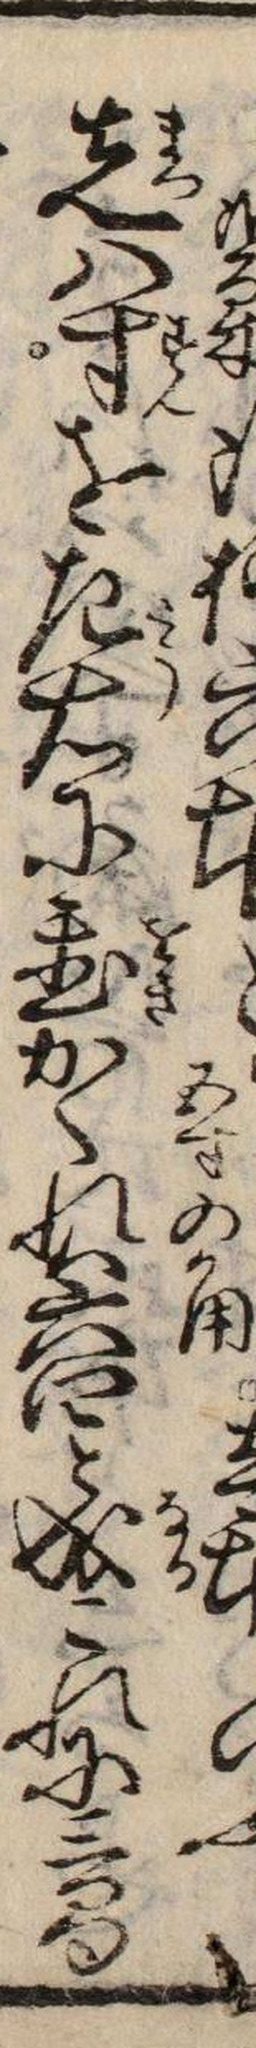先八寸を左右に置かくれは六四と成これに三間
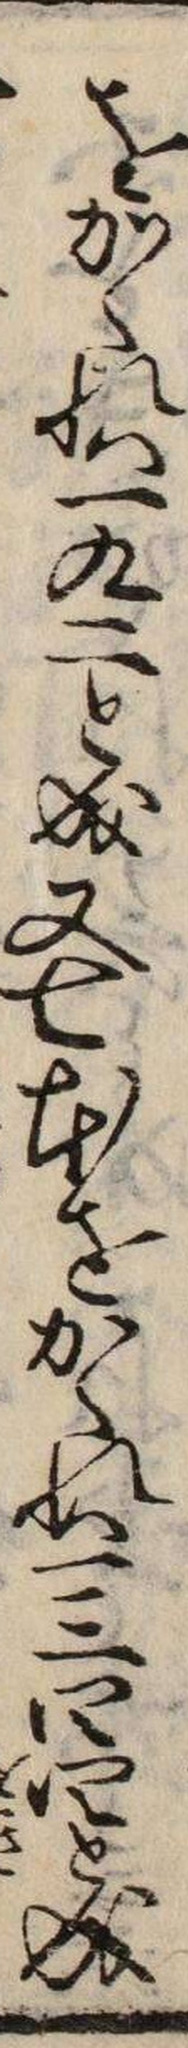をかくれは一九二と成又七本をかくれは一三四四と成
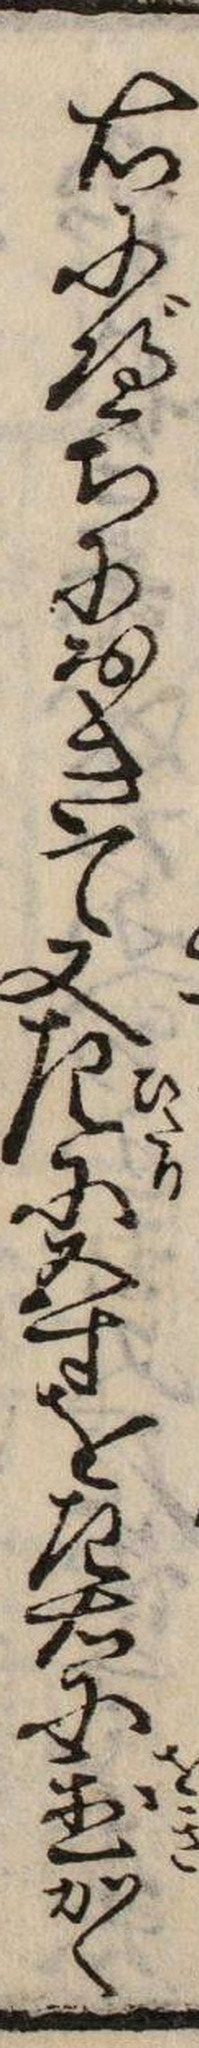右にべちにおきて又左に五寸を左右に置かく
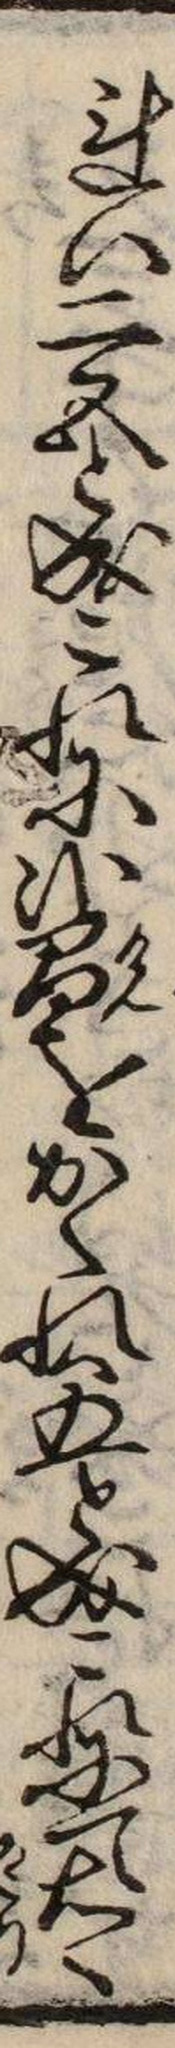れは二五と成これに弐間をかくれ五と成これにて右の
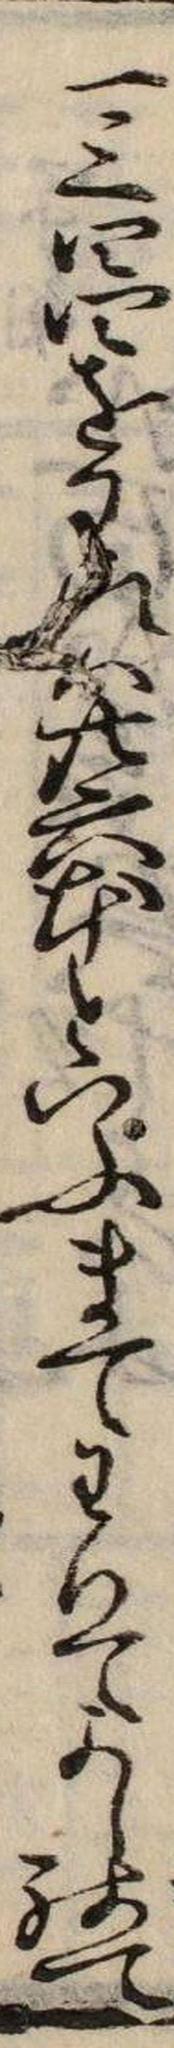一三四四をわれは廿六本といふまてわりてよし残て
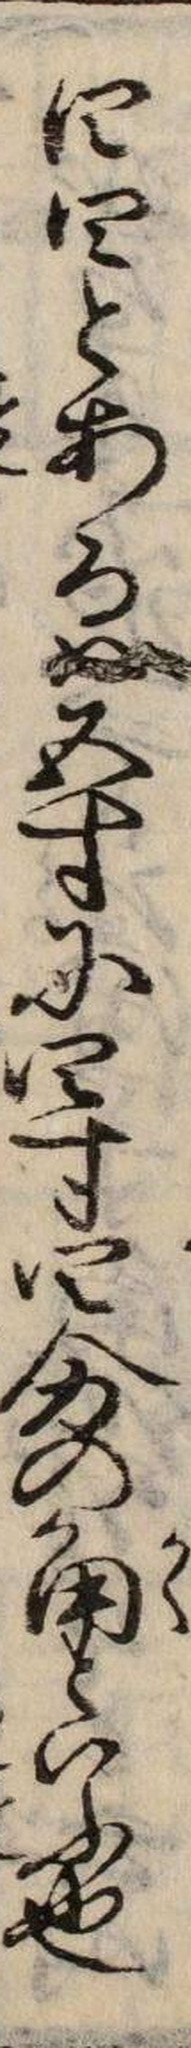四四とある五寸に四寸四分の角といふ也
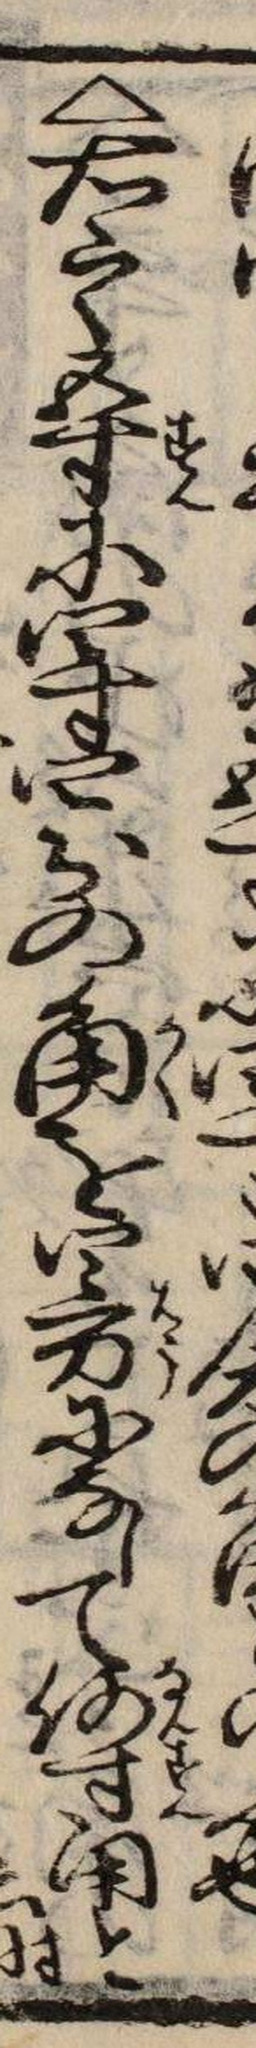△右の五寸に四寸四分の角を四方になして何寸角と云時
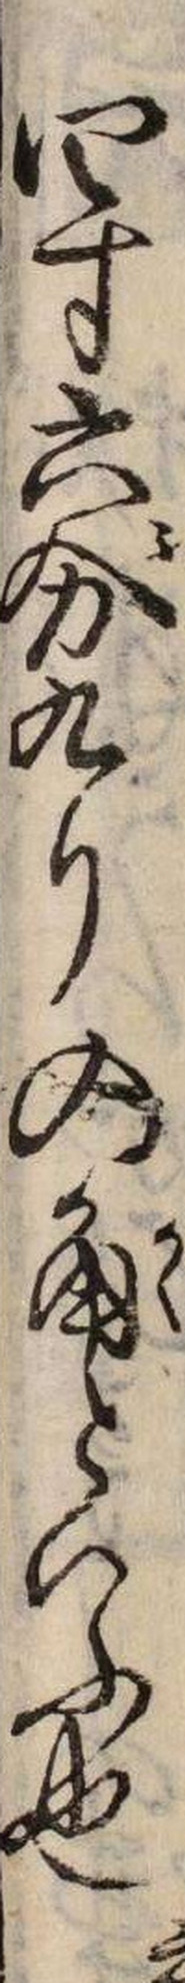四寸六分九りの角といふ也
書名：塵劫記（寛永11年自跋、京都府立京都学・歴彩館追貴8）
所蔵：京都府立京都学・歴彩館 国文学研究資料館
